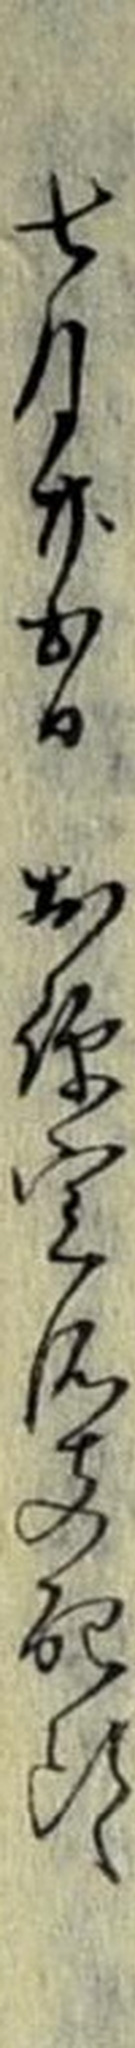七月廿五日於評定所支配頭へ
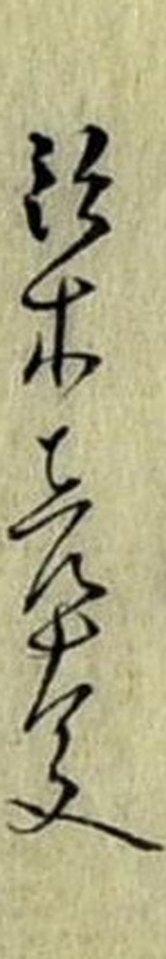鈴木彦大夫
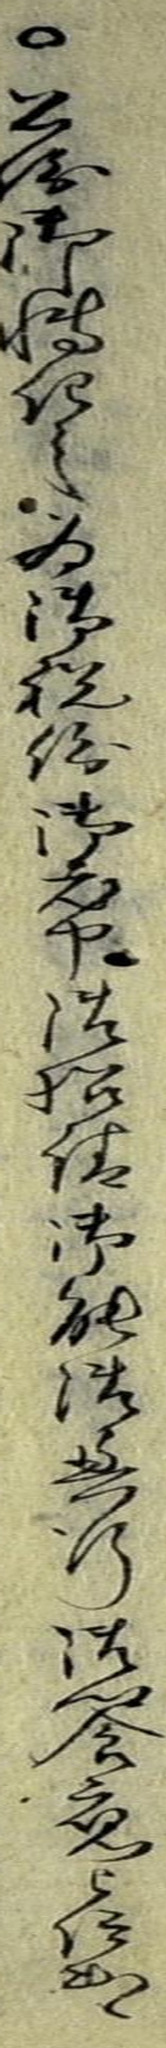〇公儀御御転任之為御祝儀御老中御招請御能御興行御饗応被仰出候
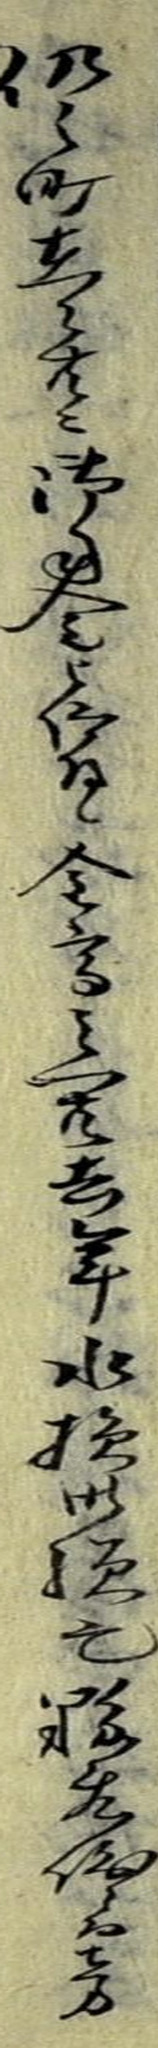仍之町在々共ニ御用金被仰付候金高ニ候へ共去年水損御損毛夥敷儀ニ而旁

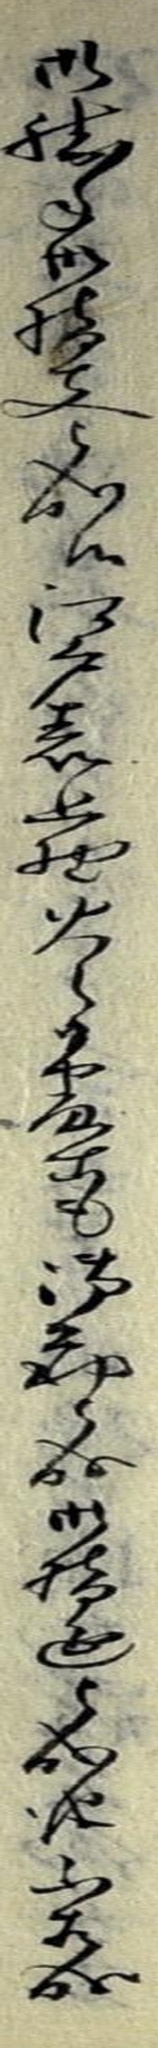御勝手御指支被成候江戸表上野火之御番等も御勤被成御指延被成儀不相成
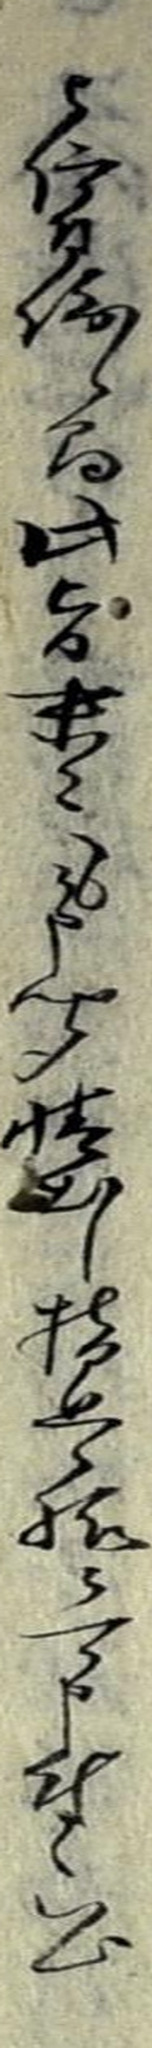被仰付儀候間此旨末々へも申聞情出し指上候様ニ可申付候以上
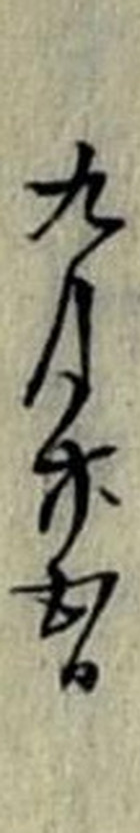九月廿五日
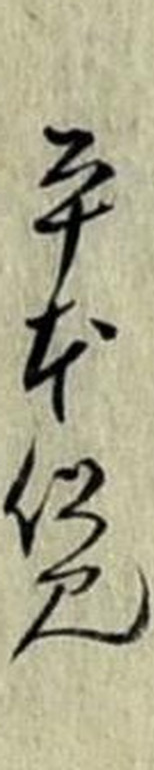平本但見
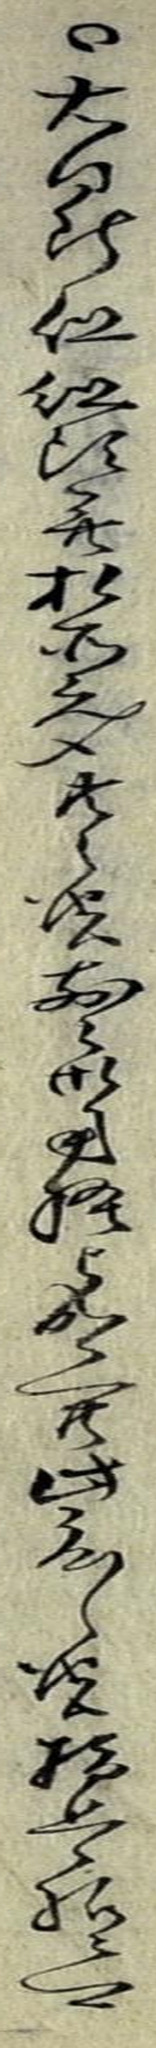〇右同断但組頭并札所元〆共之儀ハ前々御用捨被成候へ共此度之儀ハ指上候様ニ可
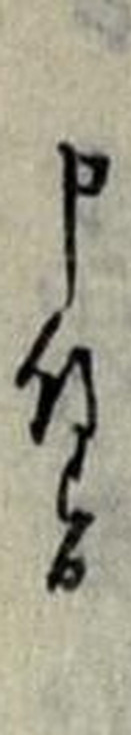申付旨
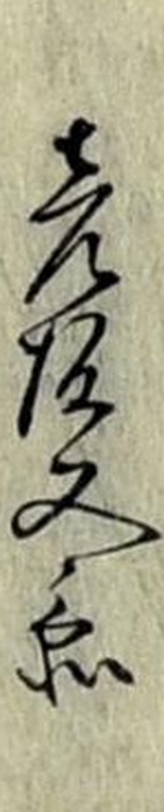彦坂又兵衛
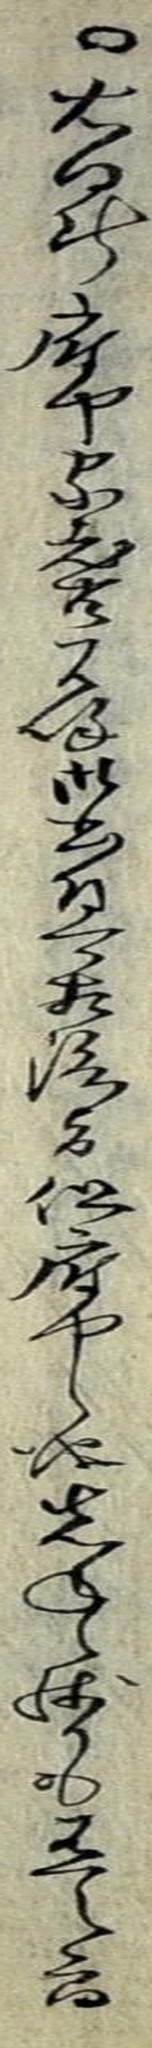〇右同断府中家老共召呼御書付可相渡旨但府中之儀先年之残りも有之候間
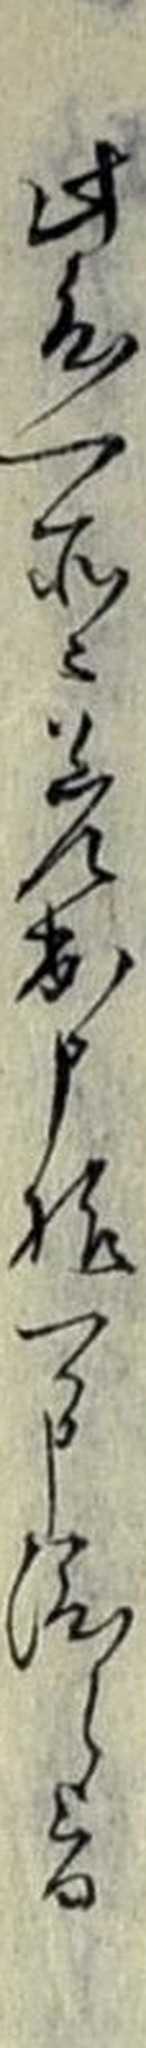此度一所ニ差出申様可申渡之旨
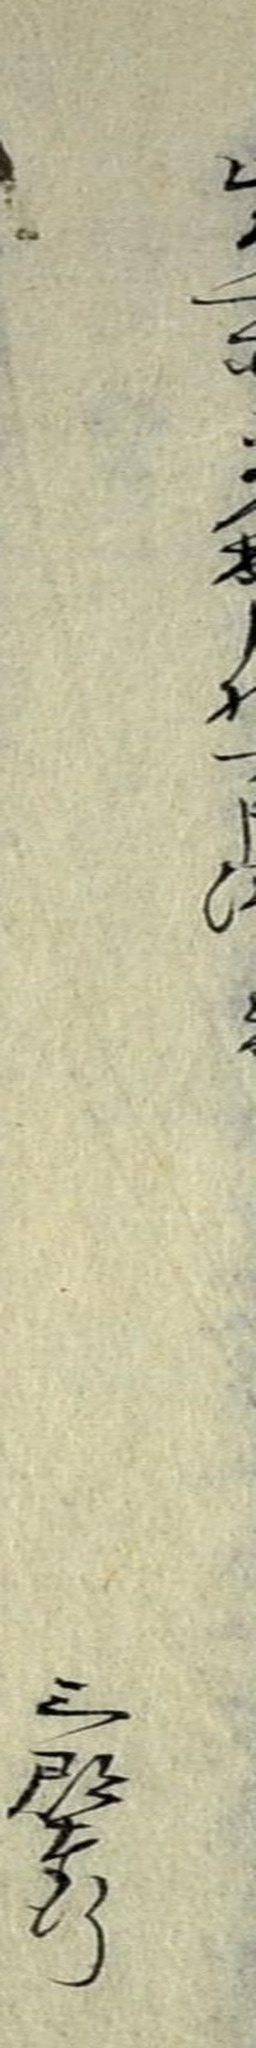三郡奉行
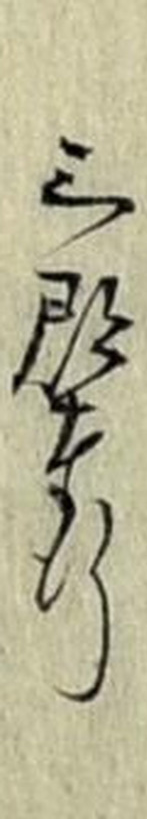三郡奉行
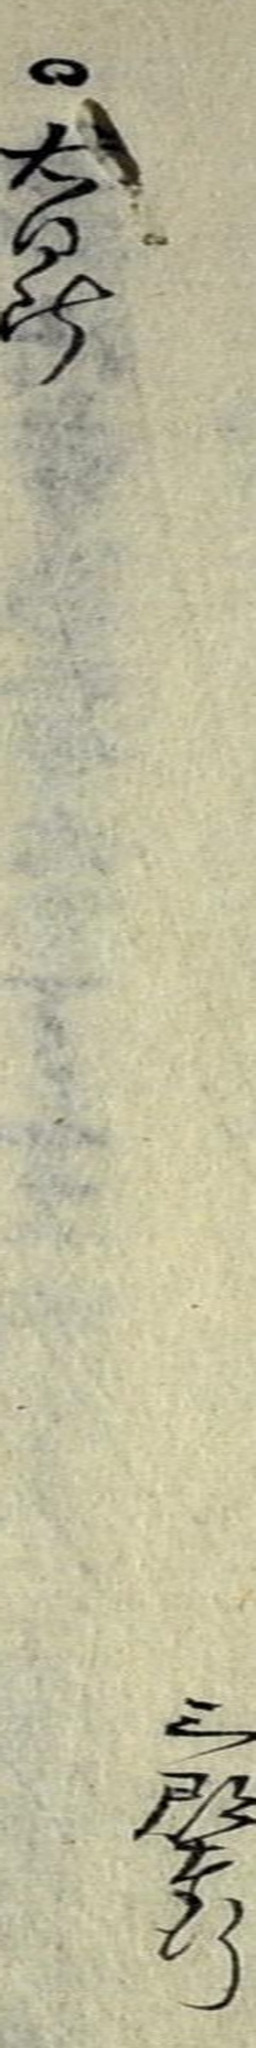〇右同断
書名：命令之部 一
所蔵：福井県文書館 Fukui Prefectural Archives
